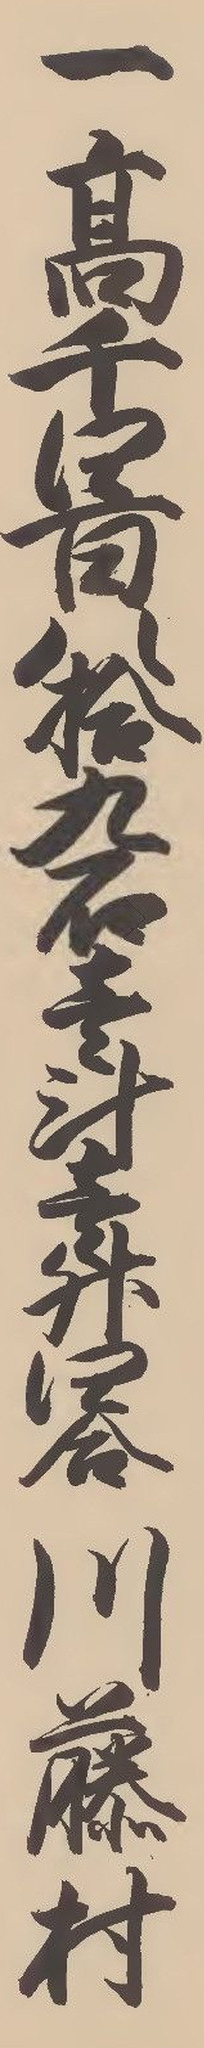一高千四百八拾九石壱斗壱升四合川藤村
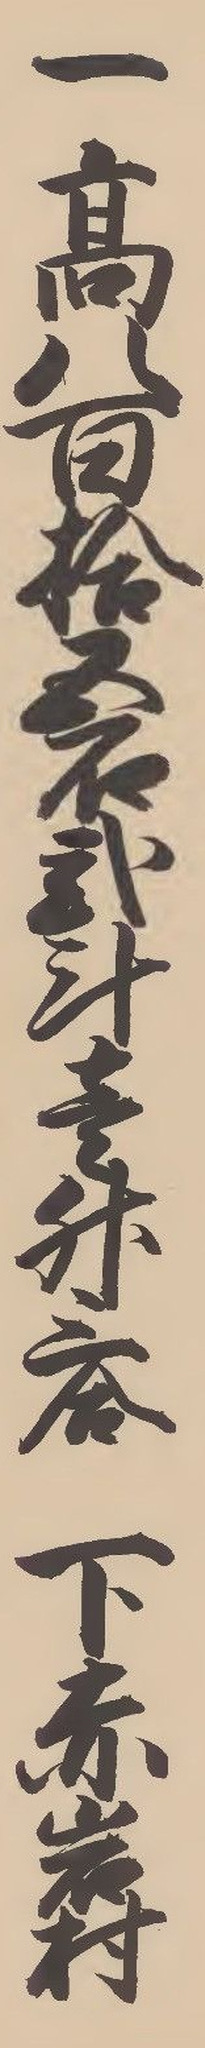一高八百拾五石弐斗壱升三合下赤岩村
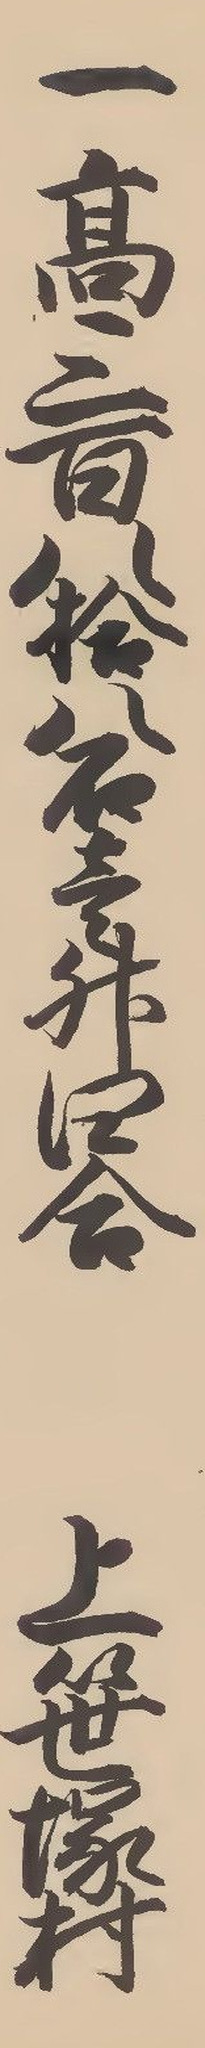一高三百八拾八石壱升四合上笹塚村
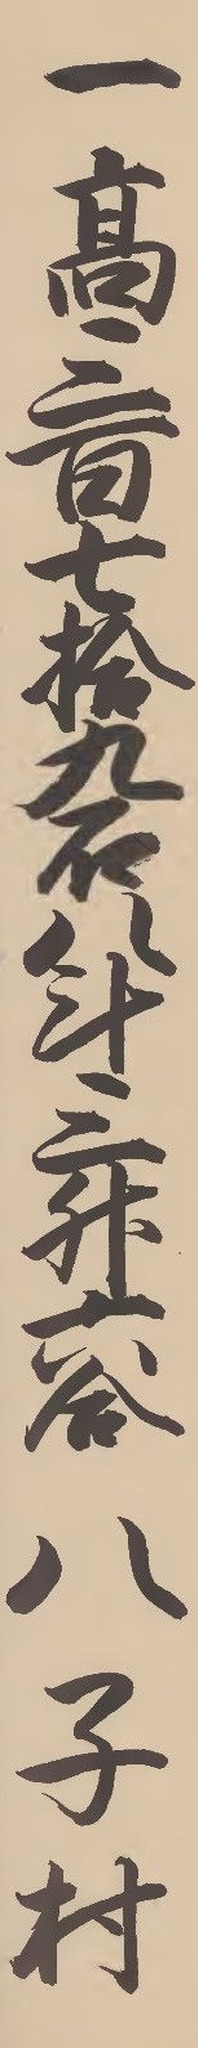一高三百七拾九石八斗三升六合八子村
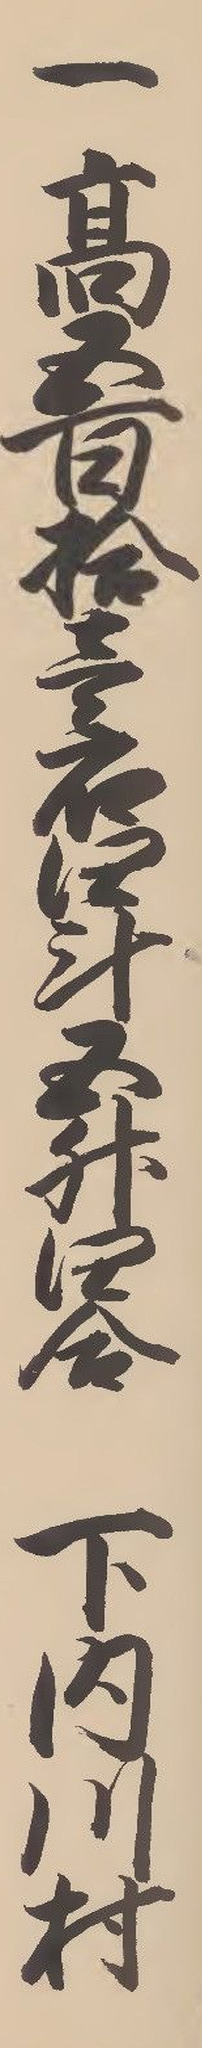一高五百拾壱石四斗五升四合下内川村
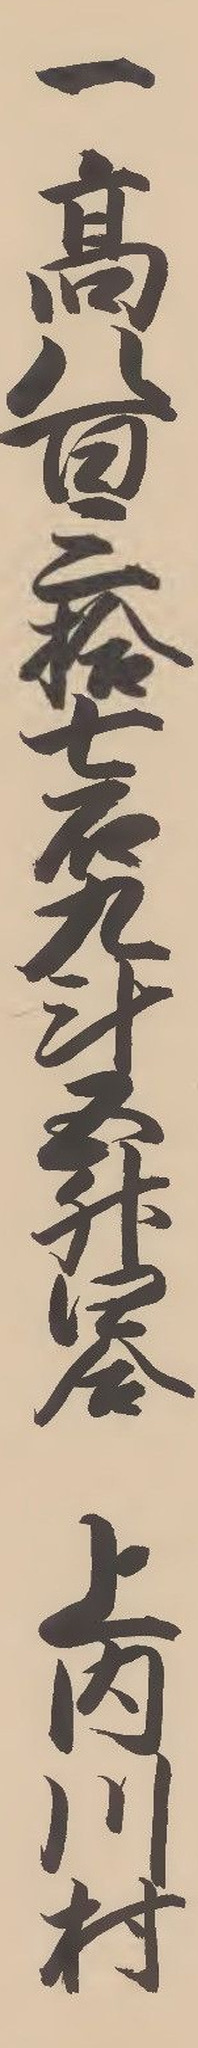一高八百三拾七石九斗五升四合上内川村
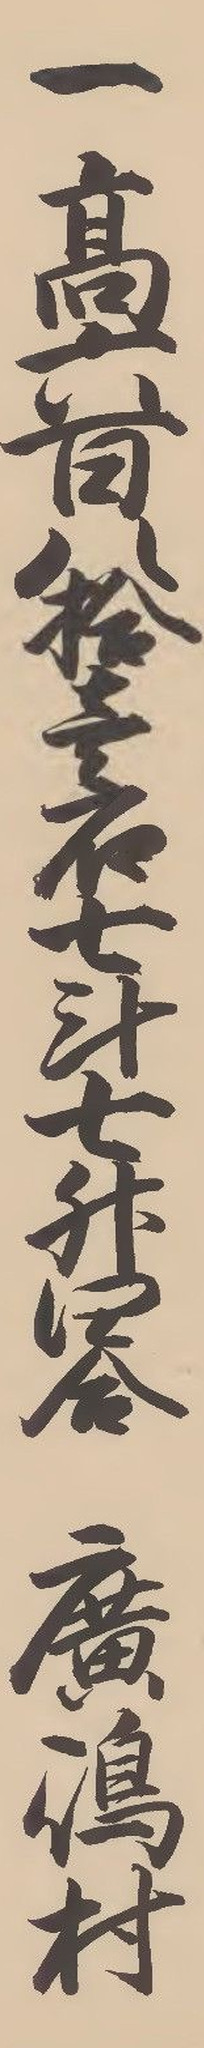一高六百八拾壱石七斗七升四合広嶋村
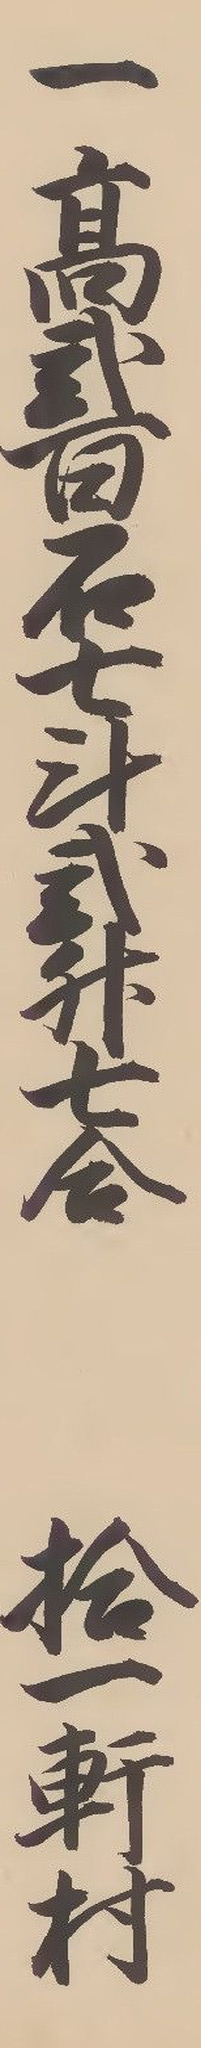一高弐百石七斗弐升七合拾一軒村

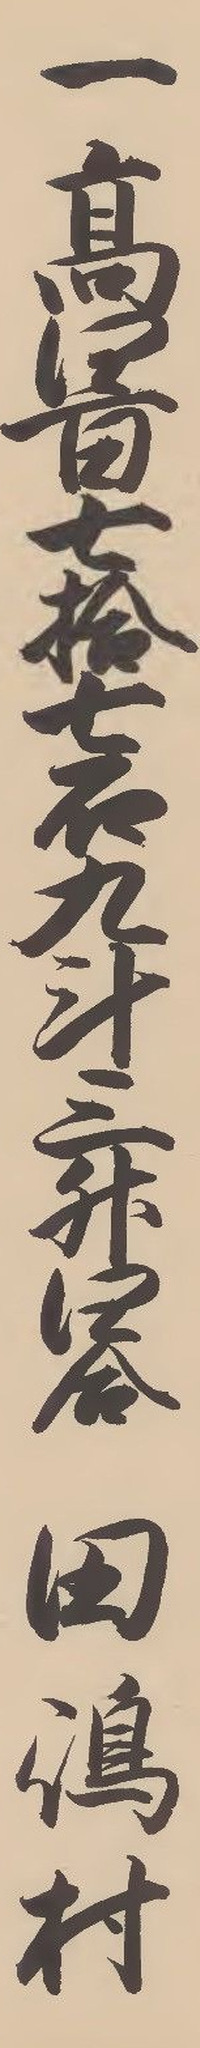一高四百七拾七石九斗三升四合田嶋村
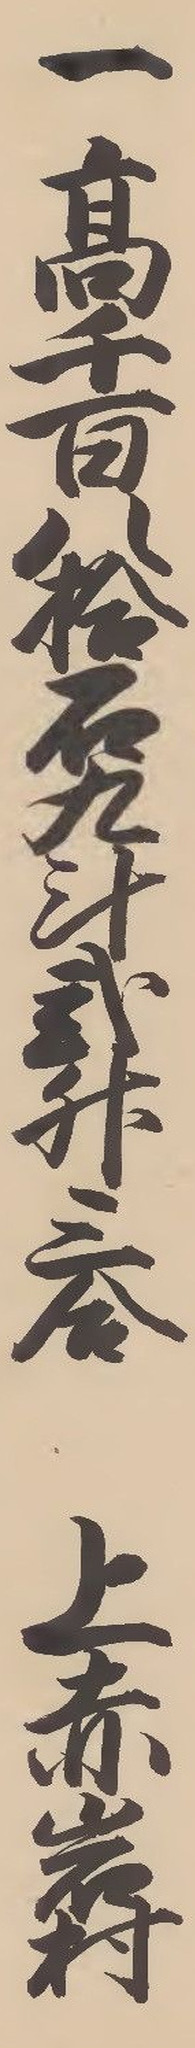一高千百八拾石九斗弐升三合上赤岩村
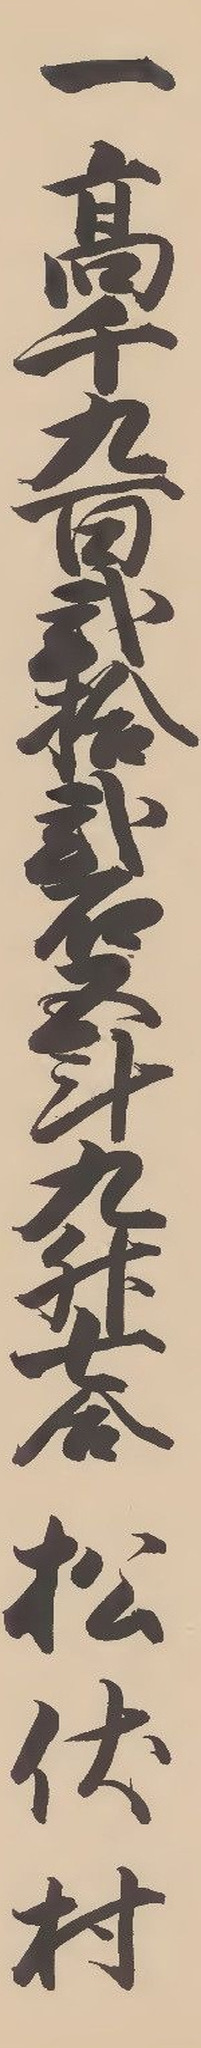一高千九百弐拾弐石五斗九升七合松伏村
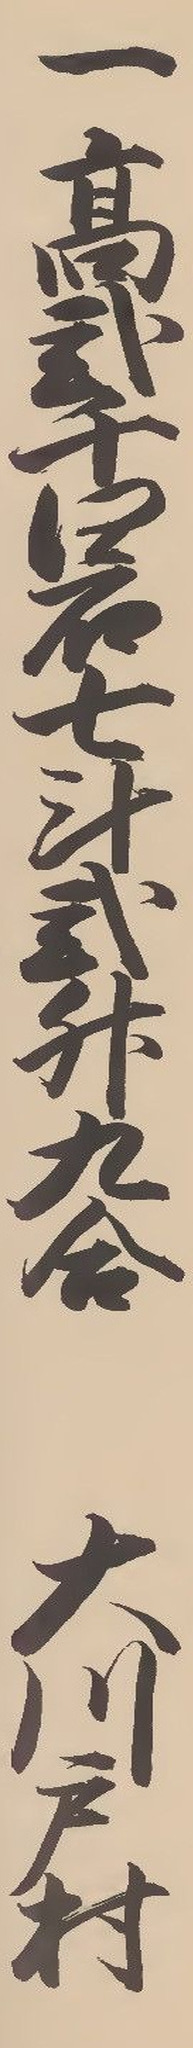一高弐千四石七斗弐升九合大川戸村
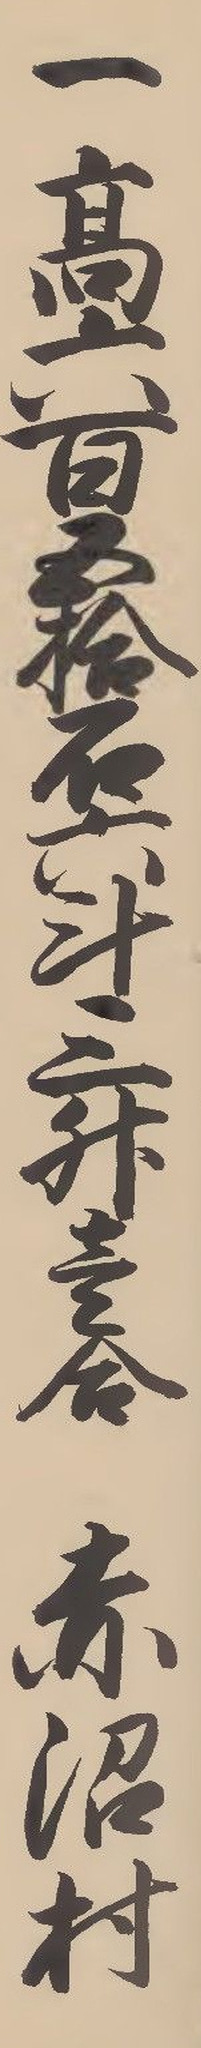一高六百五拾石六斗三升壱合赤沼村
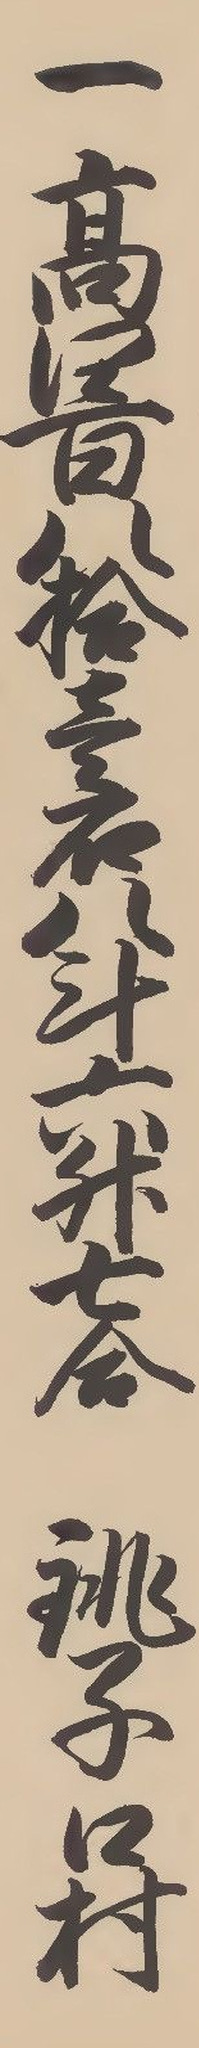一高四百八拾壱石八斗六升七合銚子口村
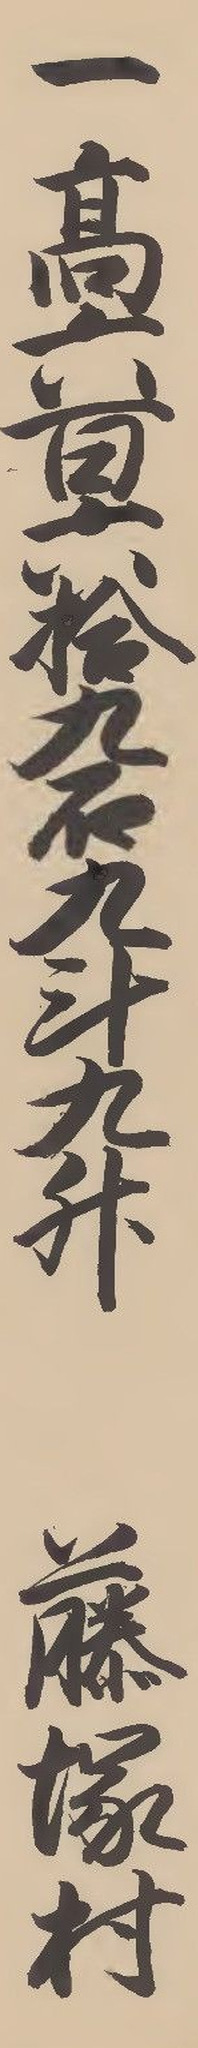一高六百六拾九石九斗九升藤塚村
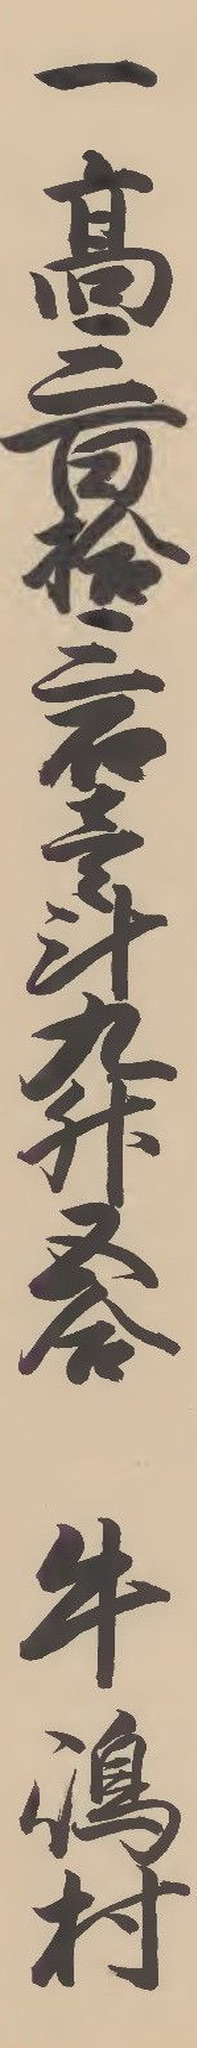一高三百拾三石壱斗九升五合牛嶋村
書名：武蔵国郷帳　下
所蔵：国立公文書館 National Archives of Japan
